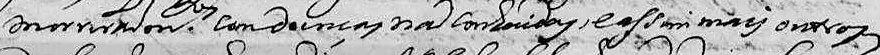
morreraõ m.tos com doenças nā conhecidas, e assim mais outros
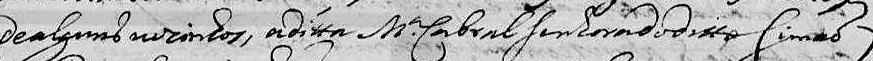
de alguns uezinhos, a ditta M.a Cabral senhora do ditto simaõ
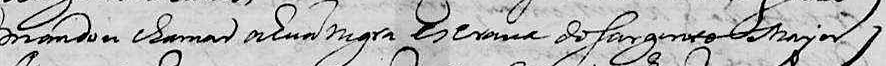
mandou chamar a huā negra escraua do sargento Mayor
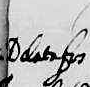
Delata foi
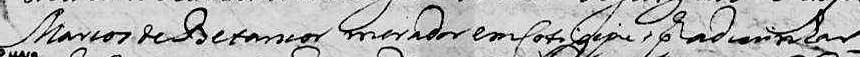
Marcos de Betancor morador em Cotigipe, pa adiuinhar
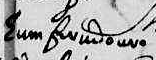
hum feruedouro
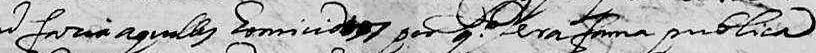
quē fazia aqueles homicidios porq.to era fama publica
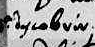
p.a descobrir
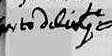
certo delinqte.
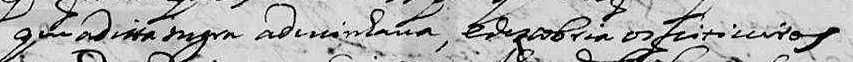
que a ditta negra adeuinhaua, e descobria os feiticeiros
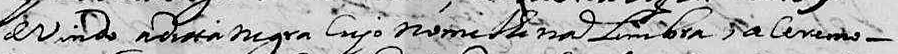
e vindo a ditta negra Cujo nome lhe naõ lembra, a ceremo
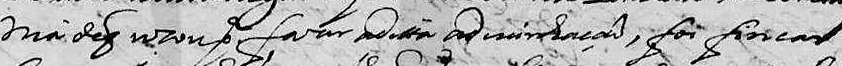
nia de q̄ uzou pa. fazer a ditta adeuinhaçaõ, foi fincar
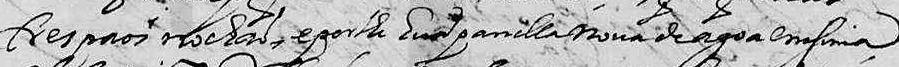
tres paos no chaõ, e porlhe huā panella noua de agoa em sima,
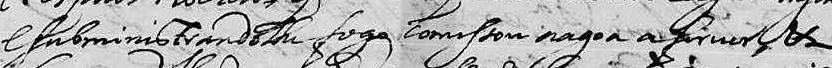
e subministrandolhe fogo comessou a agoa a feruer &a
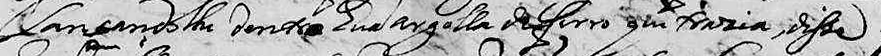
Lançandolhe dentro huā argolla de ferro que trazia, disse
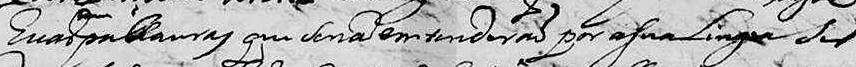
huas̄ pallauras que se nā emtenderaõ por a sua Lingoa ser
